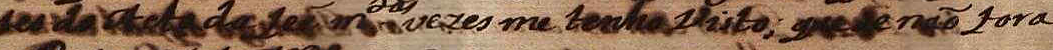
tes do Acto da feé m.tas vezes me tenho visto; que se naõ fora
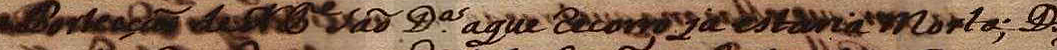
a Porteçaõ de N Pe São D.as a que Recorro ja estaria Morta; Ds̄
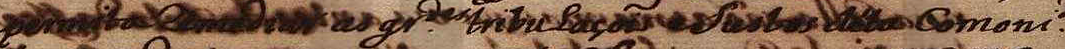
permita Remediar as gr.des tribuLaçõis e Sustos desta Comonide
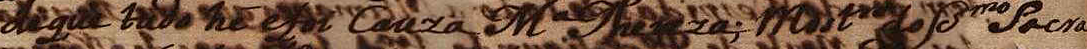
de que tudo hé e foi Cauza Ma Thereza; Mostro do Ssmo Sacra
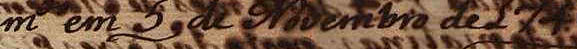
mto em 5 de Novembro de 1748
